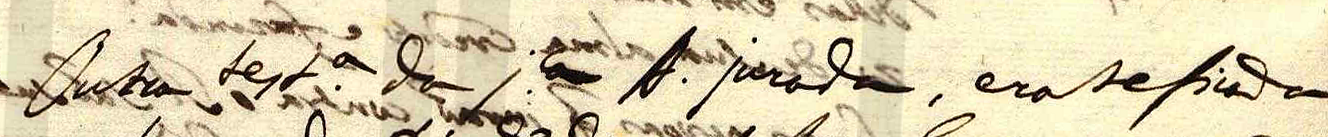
Outra test.a da j.ca A. jurada, e rateficada
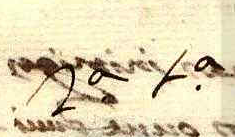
2a t.a
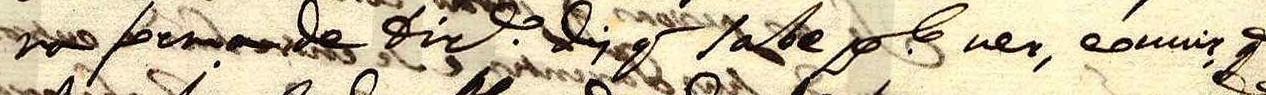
na forma de Dir.to dis q̄ sabe p.lo uer, e ouuir, q̄
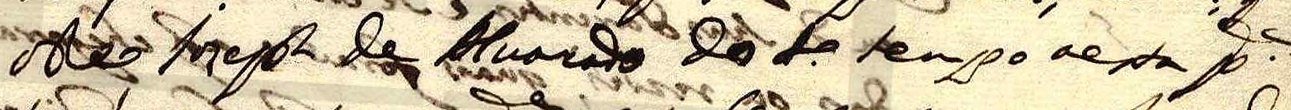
o Reo Iozeph de Aluarado do d̄.o tempo a esta p.te
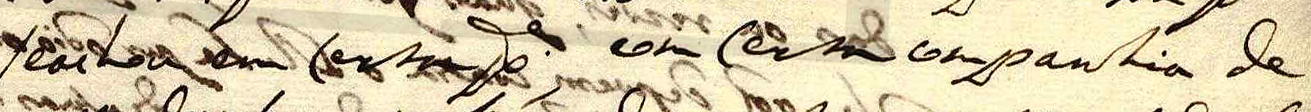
se achou em Certa p.te com Certa companhia de
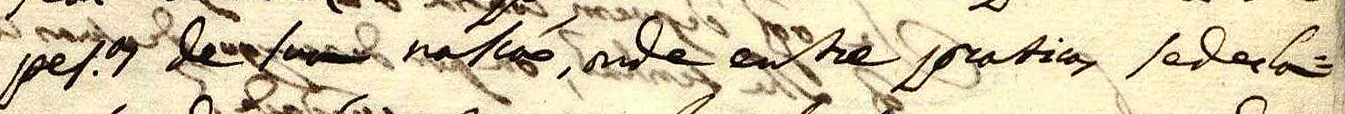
pes.as de sua nascaõ, onde entre praticas se decla
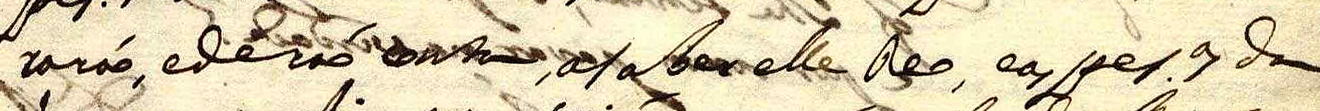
raraõ e deraõ conta, a saber elle Reo, e as pes.as da
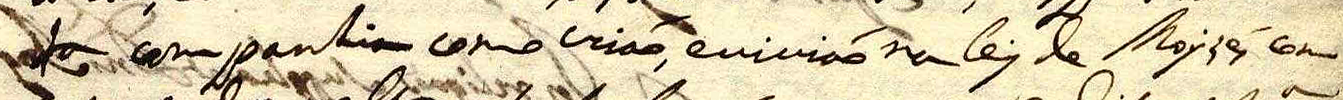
d̄a companhia como criaõ, e uiuiaõ na lej de Moyzes com
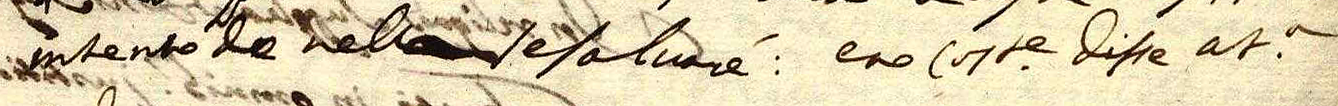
intento de nella se saluarē : e ao cost.e disse a t.a
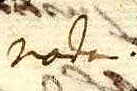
nada.
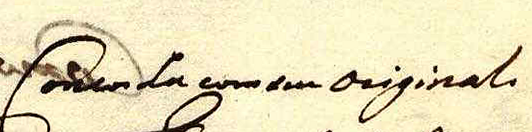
Concorda com seu original
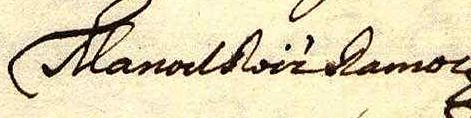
Manoel Roiz̄ Ramos
